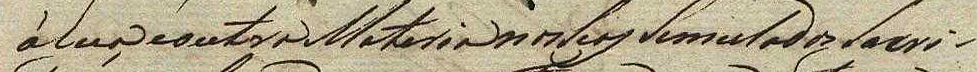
á hua, e outra Materia nos seos Semulados sacri
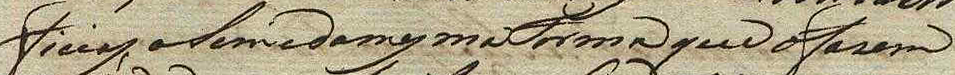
ficios, aSim e da mesma Forma que o fazem
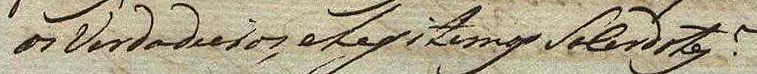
os Verdadeiros, e Legitemos SaCerdotes?
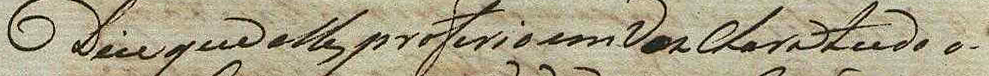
Dice que elle proferio em Voz CLara tudo o
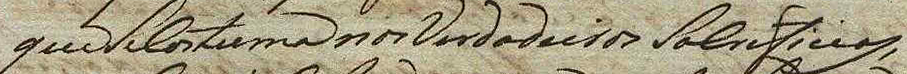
que se Costuma nos Verdadeiros SaCreficios,
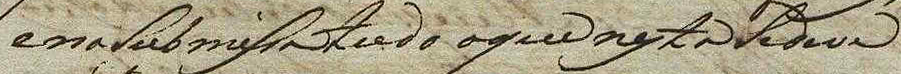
e na sub missa tudo o que nesta Se deve
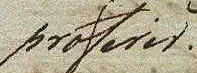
proferir.
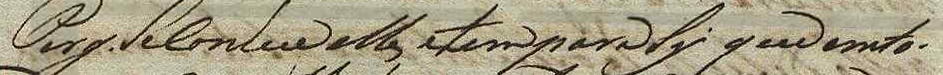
Perg. se Conhece elle, e tem para Sy que em to
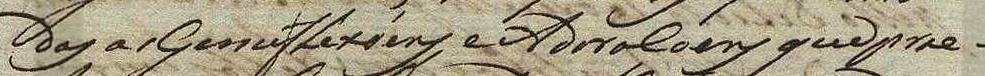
das as Genuflexoens, e AdoraCoens que prac
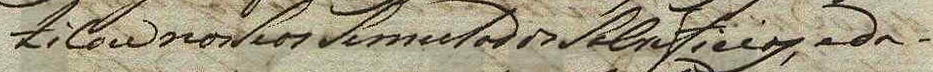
ticou nos seos Semulados SaCreficios, e da
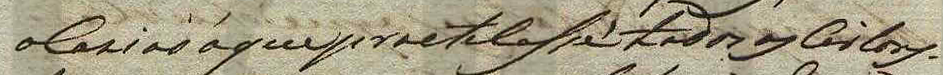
oCaziaõ a que practiCasse todos os Circons
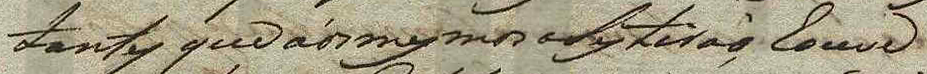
tantes que aos mesmos aSisteraõ houve
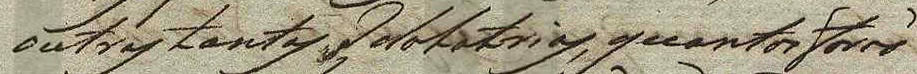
outras tantas Idolatrias, quantos foraõ
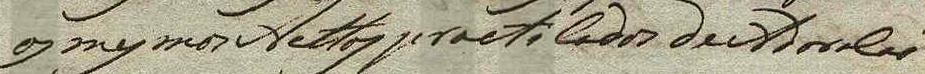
os mesmos Acttos practiCados de AdoraÇaõ
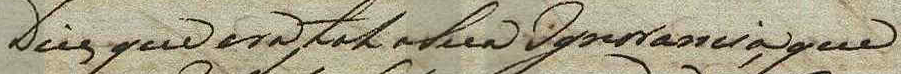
Dice que era taL a Sua Ignorancia, que
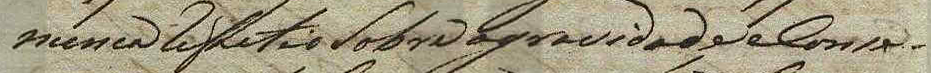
nunca Reflitio Sobre a gravidade, e Conse
